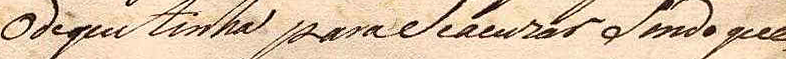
o de que tinha para se acuzar sendo que
